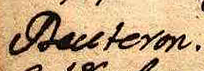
Deuteron.
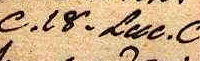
C.18. Luc. C.
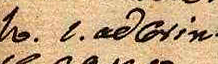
lo. 1. ad corin
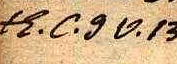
th. C.9 V.13
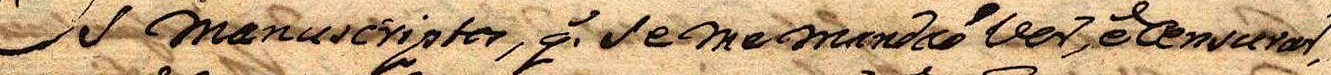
Os manuscriptos, q̄ se me mandaõ ver, ê censurar,
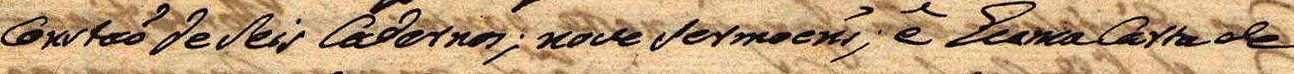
constaõ de seis Cadernos; nove sermoeñs; ê huma Carta de
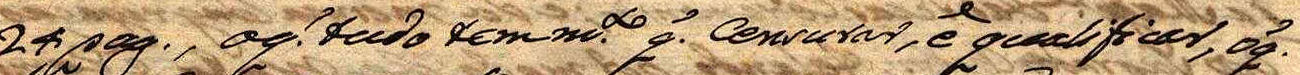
24 pag., o q̄. tudo tem m.to q̄ censurar, ê qualificar, o q̄.
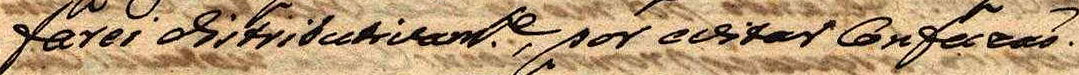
farei distributivam.te por evitar Confuzaõ.
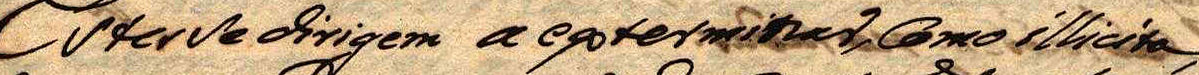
Estes se dirigem a exterminar, Como illicita,
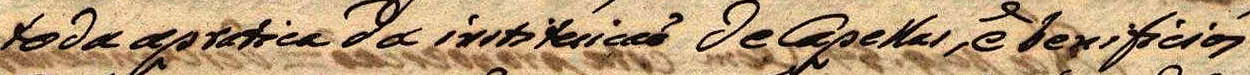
toda a pratica da instituiçaõ de Capellas, ê benificios
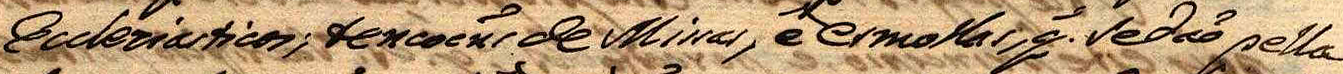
Eccleziasticos; tencoen̄s de Missas, ê esmollas, q̄ se daõ pella
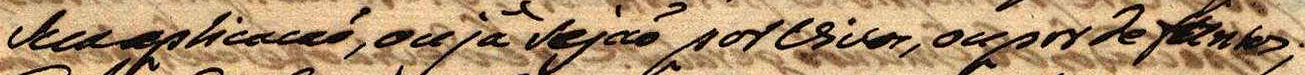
sua aplicacaõ, ou já sejaõ por vivos, ou por defuntos;
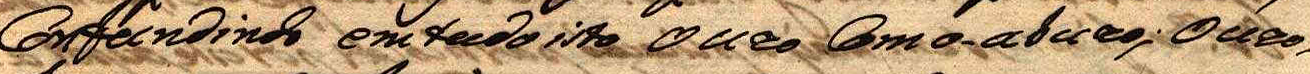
Confundindo em tudo isto o uzo Com o abuzo; O uzo,
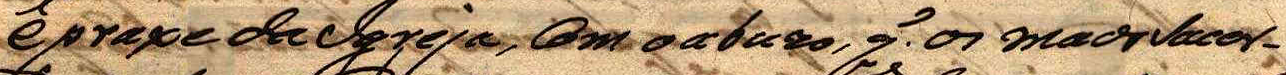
ê praxe da Jgreja, Com o abuzo, q̄ os maos sacer
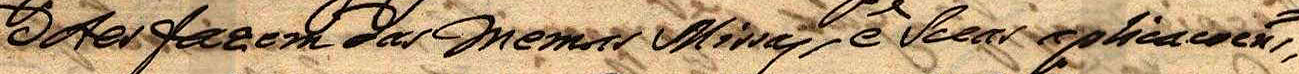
dotes fazem das memas Missas, ê suas aplicacoen̄s,
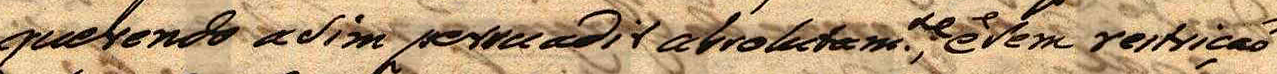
querendo asim persuadir absolutam.te, ê sem restriçaõ
